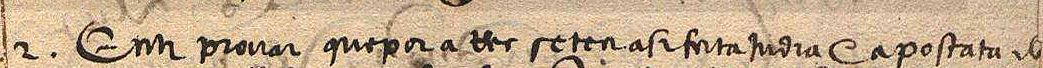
2. Ente prouar que por a Ree se teera si feita Judia e apostata de
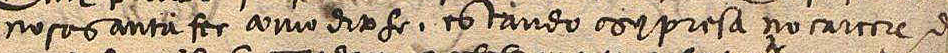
nosa santa fee como dito he . estando asy presa no carcere d
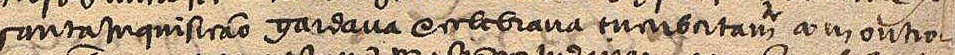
santa Jnquisição gardaua e celebraua encubertamte com outro
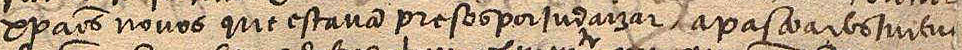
xpaõs nouos que estauā presos por Judaizar a pascoa dos Judeu
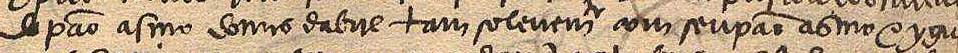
do pão asmo do mes dabril tam solenemte com seu pão asmo e ygu
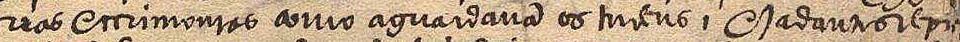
rias e cerimonjas como a guardauā os Judeus, e Ja dantes de pre
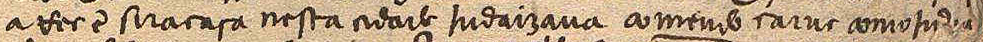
a Ree ē sua casa nesta cidade Judaizaua comendo carne como Judia
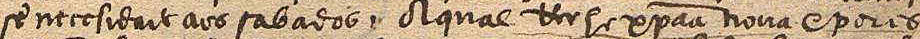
sē necesidade aos sabados, A qual Ree he xpāa noua e por es
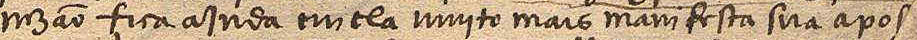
rrezão fica aJnda em ela mujto mais manjfesta sua apos
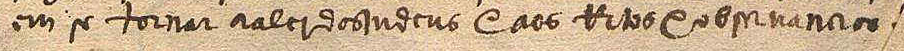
em se tornar aa lej dos Judeus e aos Ritos e obseruancias
